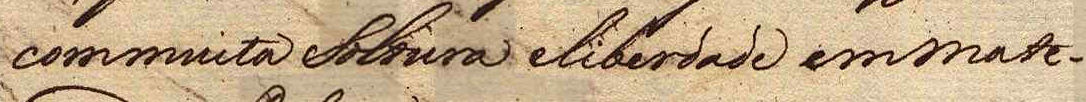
com muita Soltura e liberdade em mate
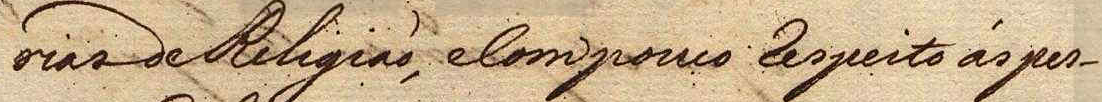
rias de Religiaõ, e Com pouco Respeito ás pe
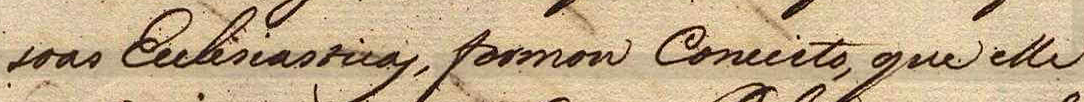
soas Ecclesiasticas, formou Conceito, que elle
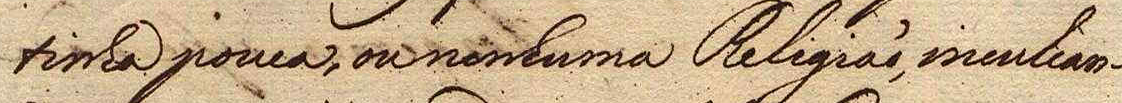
tinha pouca, ou nenhuma Religiaõ, inculcan
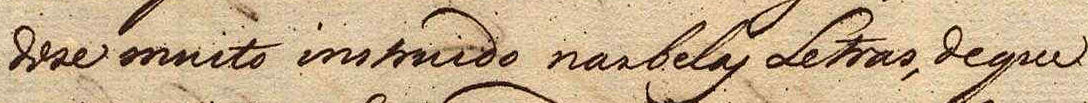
dose muito instruido nas belas Letras, de que
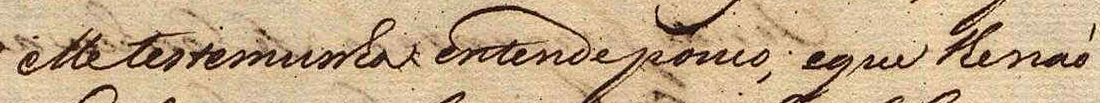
elle testemunha entende pouco, e que lhe naõ
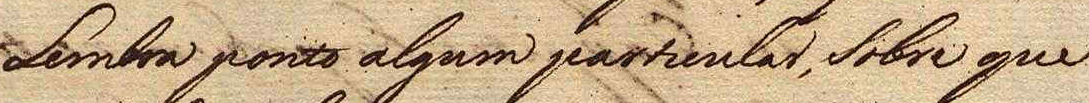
Lembra ponto algum particular, Sobre que
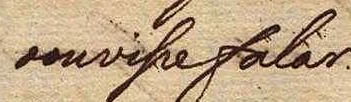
o ouvisse falar.
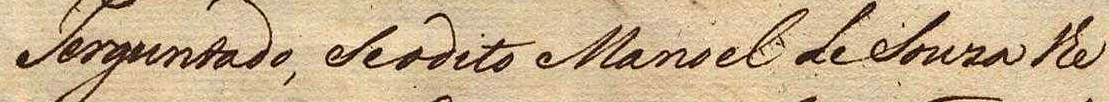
Perguntado, Se o dito Manoel de Souza lhe
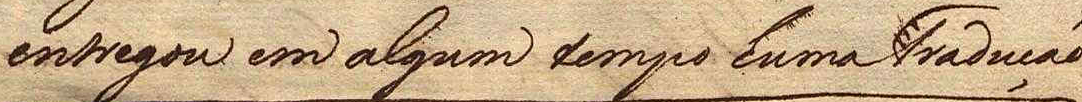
entregou em algum tempo huma Traduçaõ
